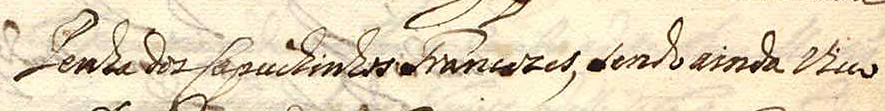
Penha dos Capuchinhos Francezes, sendo ainda Viuo
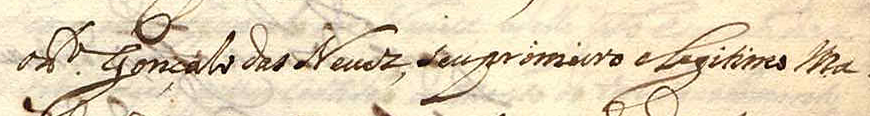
o d̄o. Gonçalo das Neuez, seu primeiro e legitimo Ma
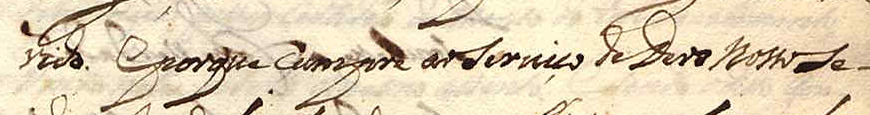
rido. E porque cumpre ao Seruiço de Deos nosso Se
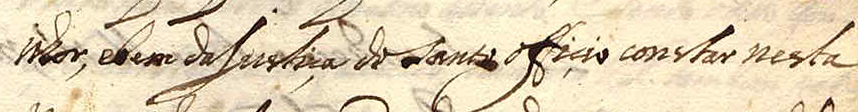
nhor, e bem da Justiça do santo officio constar nesta
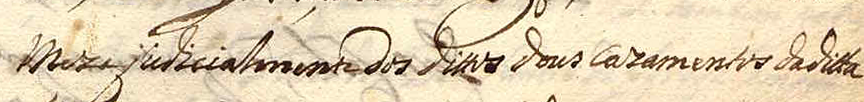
Meza judicialmente dos dittos dous cazamentos da ditta
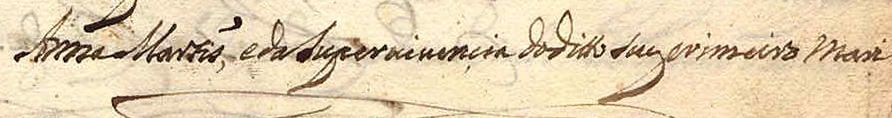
Anna Martis̄, e da Superuiuencia do ditto seu primeiro mari
